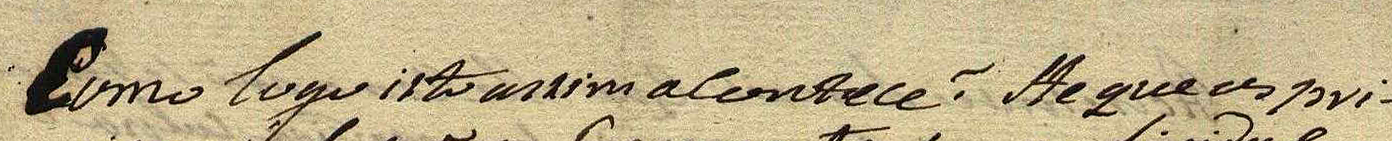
Como logo isto assim acontece? He que os pri
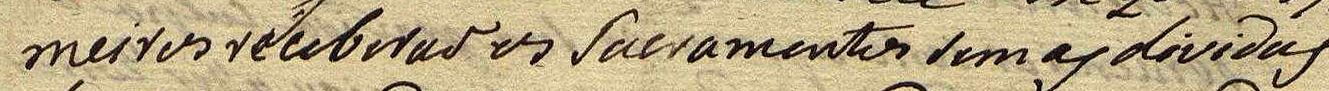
meiros receberaõ os sacramentos sem as dividas
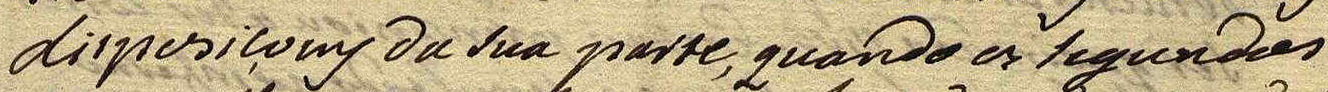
disposiçoens da sua parte, quando os segundos
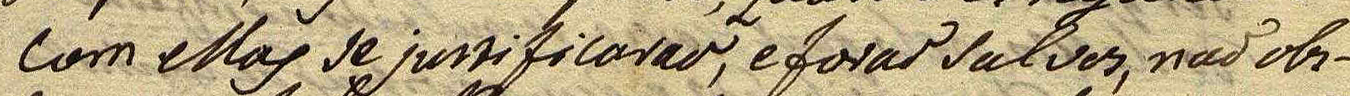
com ellas se justificaraõ, e foraõ salvos, naõ obs
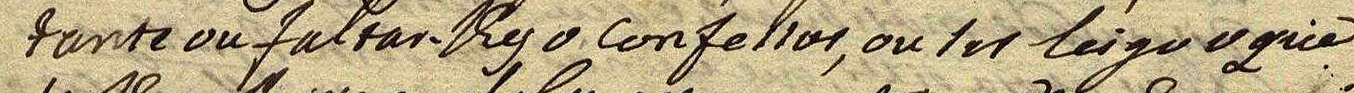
tante ou faltar-lhes o confessor, ou ser leigo o que
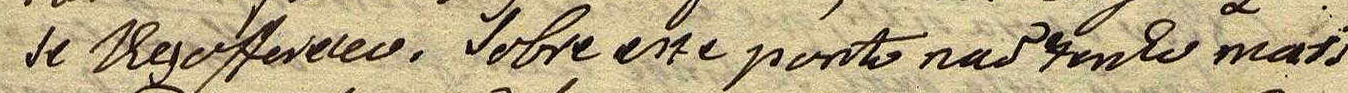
se lhes offereceo. sobre este ponto naõ tenho mais
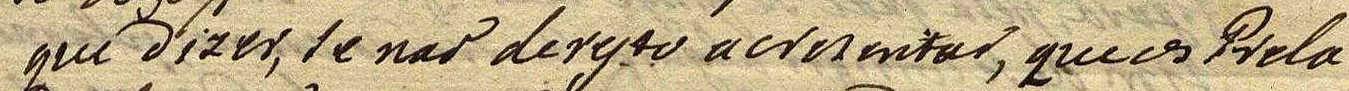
que dizer, se naõ de resto acrezentar, que os Prela
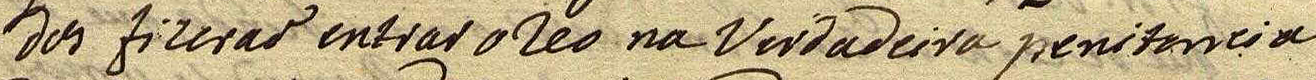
dos fizeraõ entrar o Reo na Verdadeira penitencia
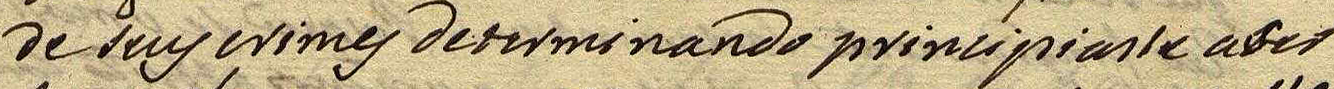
de seus crimes determinando principiasse a ter
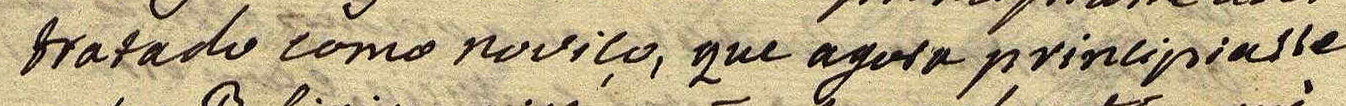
tratado como noviço, que agora principiasse
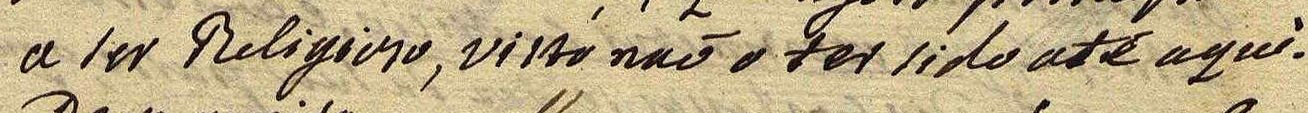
a ser Religioso, visto naõ o ter sido até aqui.
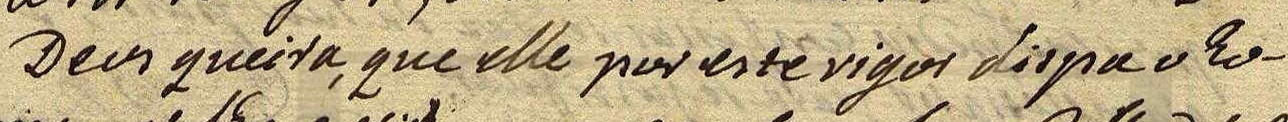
Deos queira, que elle por este rigor dispa o ho
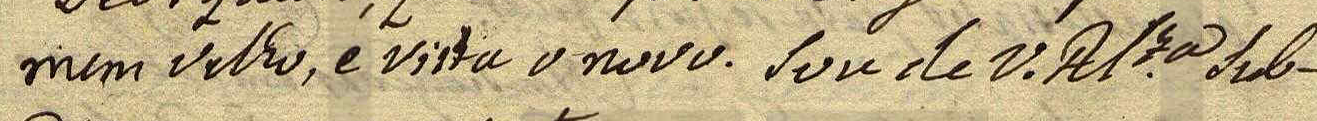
mem velho, e vista o novo. sou de V. Al.za Sub
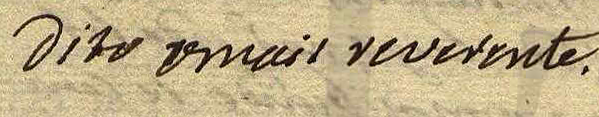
dito o mais reverente.
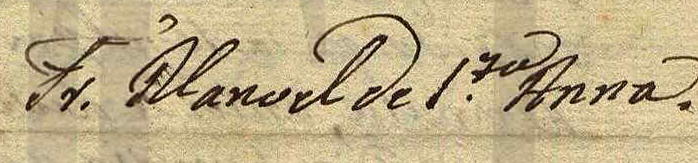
Fr. Manoel de S.ta Anna.
